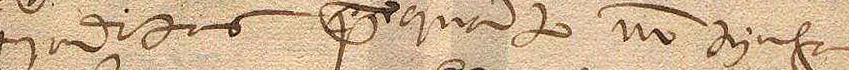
traditas p̄oquāto n̄o tynha
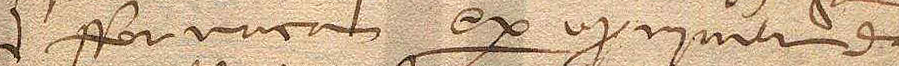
ēfformaçam e ꝑ o ꝓcurador da
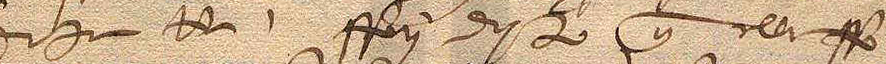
dita Re ffoy dyto q̄ elle ffo
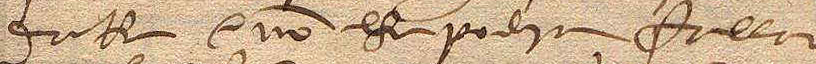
da Re e nō lhe podera fallar
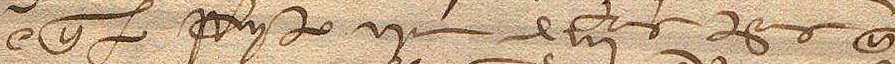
e q̄ ho ffeyto era de mtas tas q̄
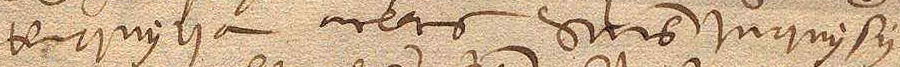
Requyrja a elles Snr̄s Jnquysy
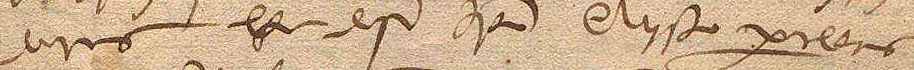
dores lhe desē tp̄o e vysto ꝑ elles
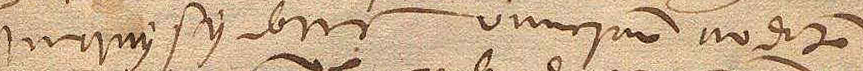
Jmquysydores ouuerão ao dito
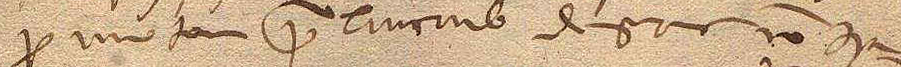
ꝓmotor p̄o lançado de suas c̄otra
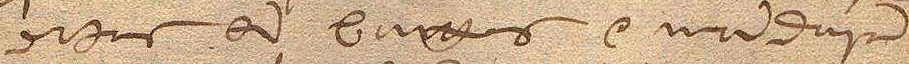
ditas e ēbargos e mādarā
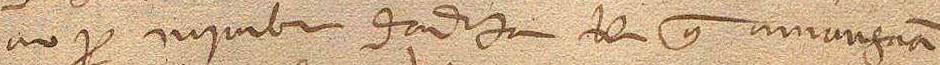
ao ꝓcurador da dita Re q̄ amanhaā
